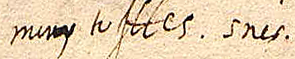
muyto Jlles. snes̄.
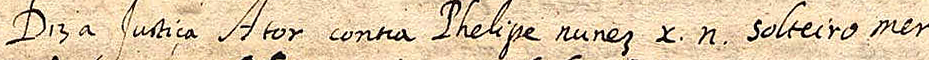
Diz a Justiça Ator contra Phelipe nunez x. n. solteiro mer
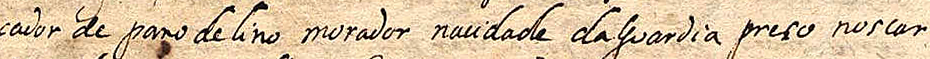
cador de pano de lino morador na cidade da Goardia preso nos car
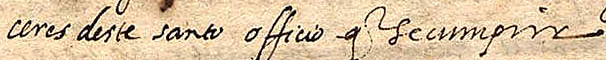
ceres deste santo officio q̄ se cumprir
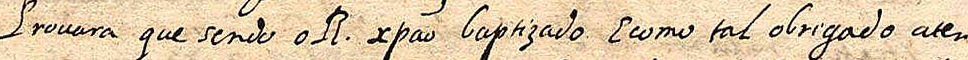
Prouara que sendo o R. xpão baptizado E como tal obrigado a ter
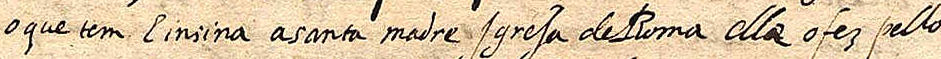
o que tem E insina a santa madre JgreJa de Roma elle o fez pello
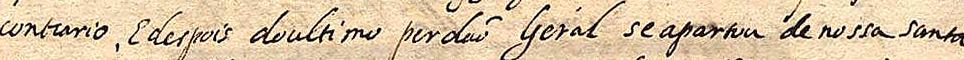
contrario, E despois do ultimo perdaõ Geral se apartou de nossa santa
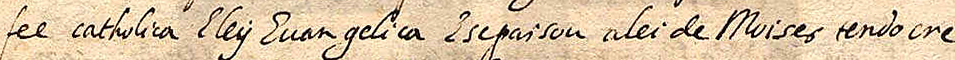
fee catholica E ley Euangelica E se passou a lei de Moises tendo cre
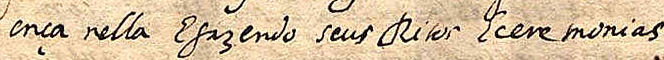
ença nella E fazendo seus Ritos E ceremonias
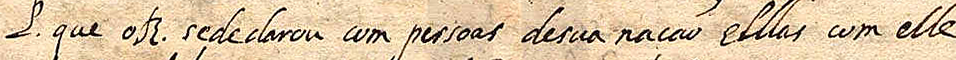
P. que o R. se declarou com pessoas de sua naçaõ E Ellas com elle
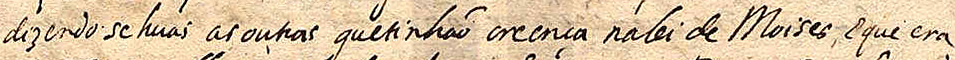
dizendo se huās as outras que tinhaõ creença na lei de Moises, E que era
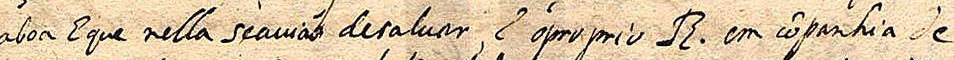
a boa E que nella se auiaõ de saluar, E o proprio R. em cōpanhia de
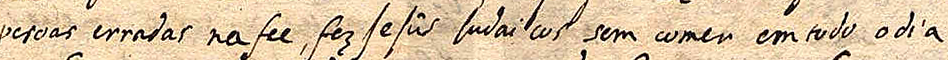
pesoas erradas na fee, fez JeJūs Judaicos sem comer em todo o dia
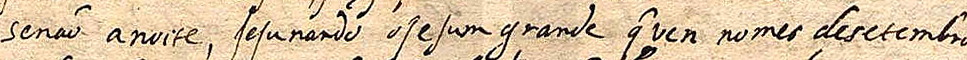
senāo a noite, Jejunando o JejJum grande q̄ ven no mes de setembro
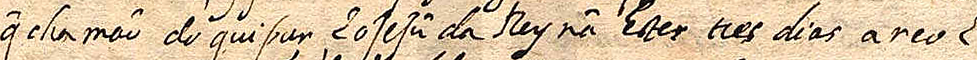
q̄ chamaõ do quipur, E o JeJū da Reynā Ester tres dias a reo E
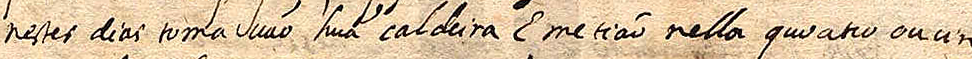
nestes dias toma uaõ huā caldeira E metiaõ nella quoatro on cin
